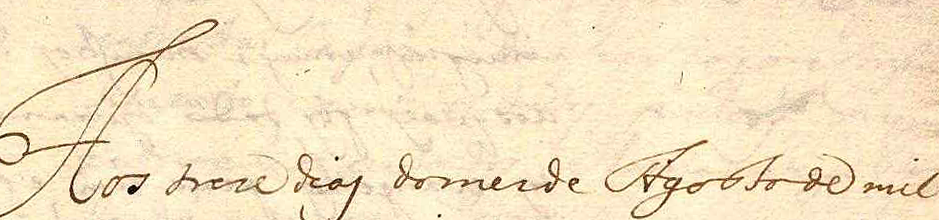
Aos treze dias do mes de Agosto de mil
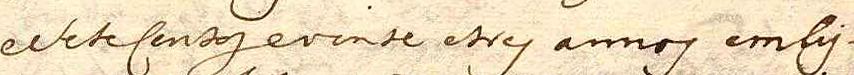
e seteCentos e vinte e tres annos em lis
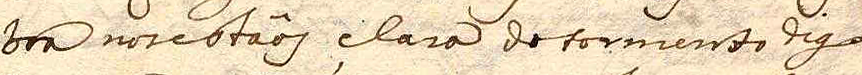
boa nos estaôs, e Caza do tormento digo
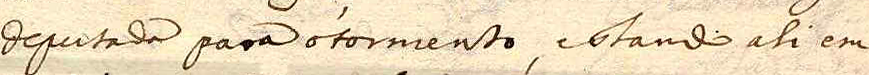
deputada para o tormento, estando ahi em
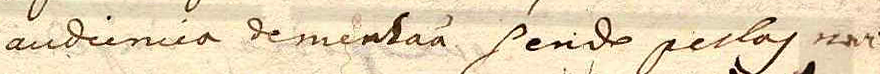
audiencia de menhaã sendo pellas nove
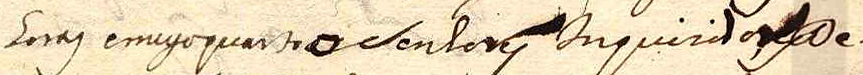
horas e meyo quarto o Senhores Inquizidores De
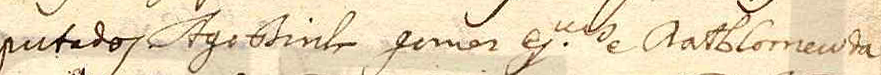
putados Agostinho gomes g.ues e Bathlomeu da
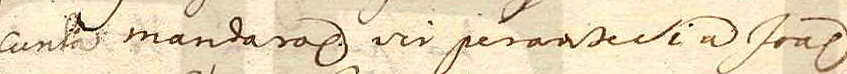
cunha mandaraõ vir perante si a Joaõ
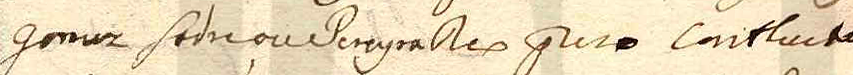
gomez Sodre, ou Pereyra Reo prezo contheudo
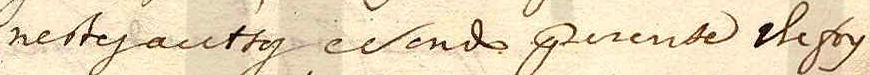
nestes auttos, e Sendo prezente lhe foy
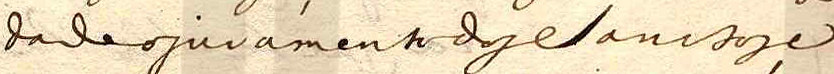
dado o juramento dos Sanctos, e
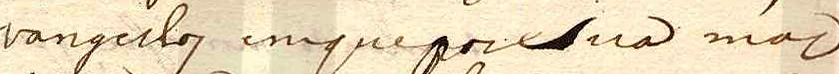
vangelhos em que pos Sua maõ
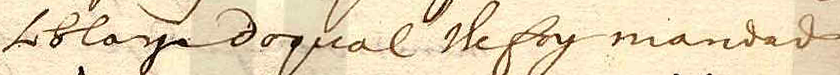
sob cargo do qual lhe foy mandado
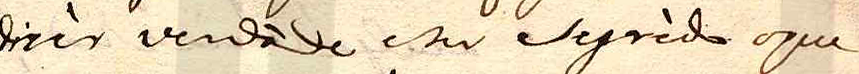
dizèr verdàde, e ter segrèdo o que
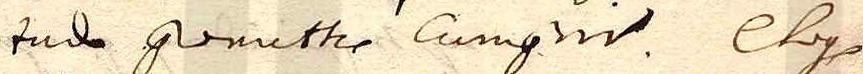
tudo prometteo cumprir. E logo
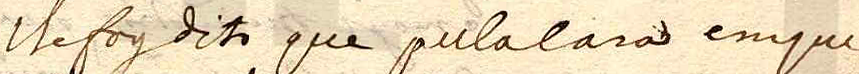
lhe foy dito que pella caza em que
